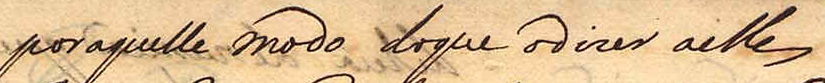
por aquelle modo do que o dizer a elle
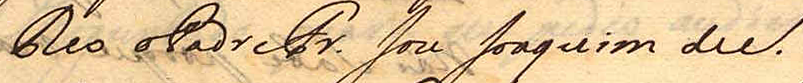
Reo o Padre Fr. Joze Joaquim de S.
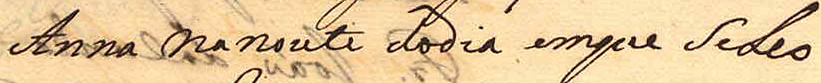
Anna na noute do dia em que se Leo
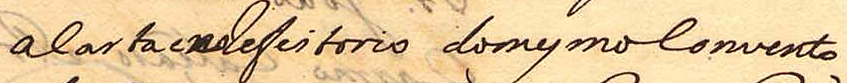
a carta e no Refeitorio do mesmo Convento
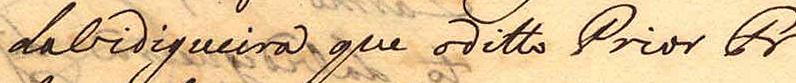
da Vidigueira que o ditto Prior Fr
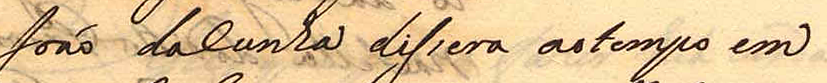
Joaõ da Cunha dissera ao tempo em
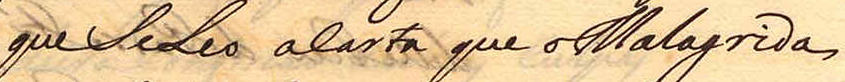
que Se Leo a carta que o Malagrida
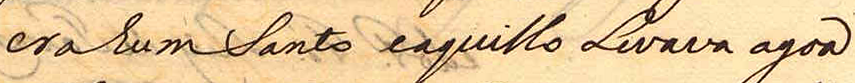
era hum Santo e aquillo Levava agoa
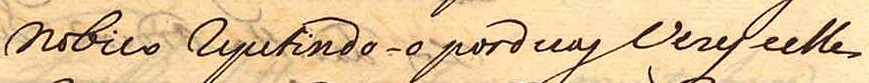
no bico repetindo-o por duas vezes e elle
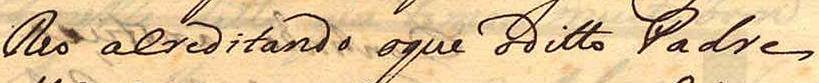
Reo acreditando o que o ditto Padre
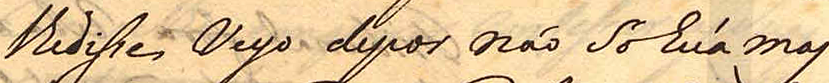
lhe disse Veyo depor naõ só huã mas
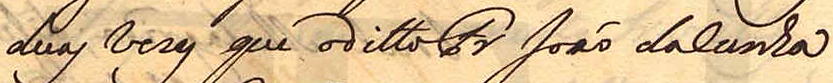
duas vezes que o ditto Fr Joaõ da Cunha
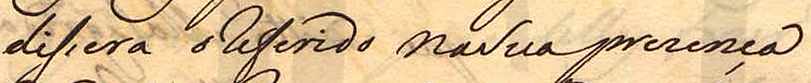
dissera o Referido na sua prezença
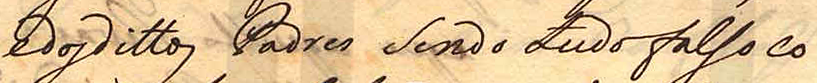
e dos dittos Padres sendo tudo falso co
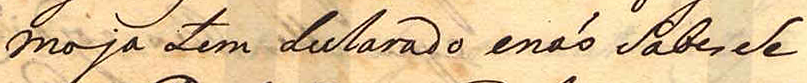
mo ja tem declarado e naõ sabe se
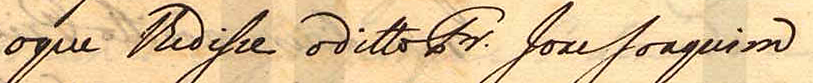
o que lhe disse o ditto Fr. Joze Joaquim
